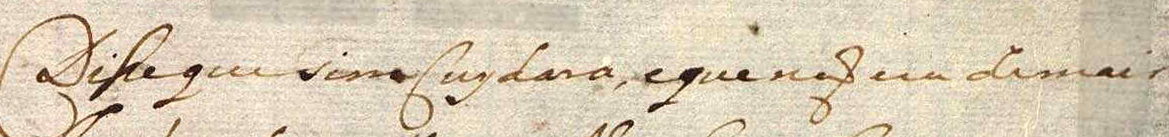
Disse que sim Cuydara, e que naõ era de mais
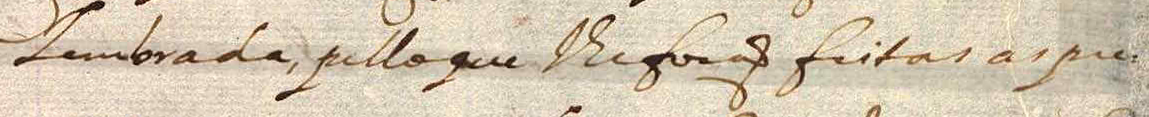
Lembrada, pello que lhe foraõ feitas as pre
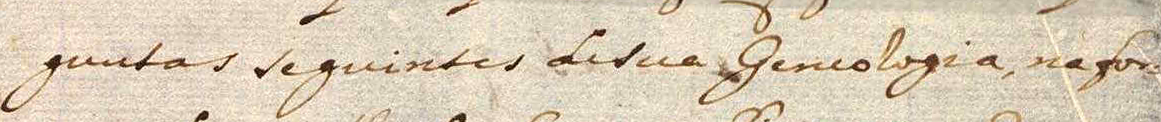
guntas seguintes de sua Geneologia, na for
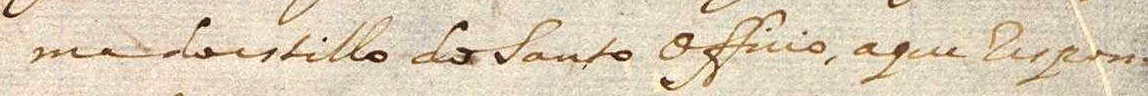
ma do estillo do Santo Officio, a que Respon
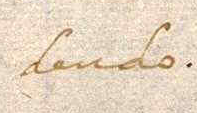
dendo.
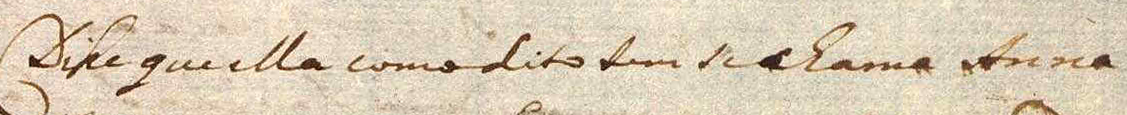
Disse que ella como dito tem se chama Anna
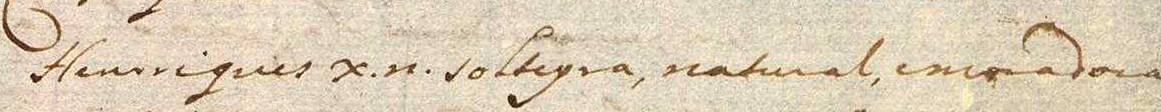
Henrriques x. n. solteyra, natural, e moradora
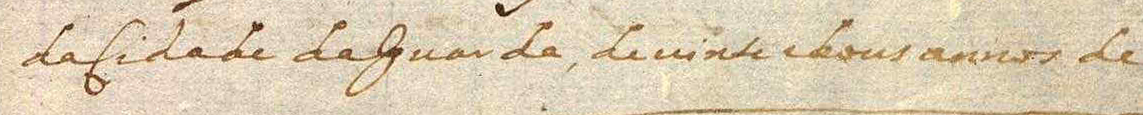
da Cidade da Guarda, de uinte e dous annos de
